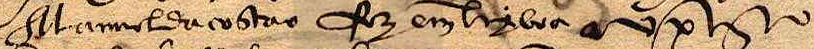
Manuel da costa o fez em lixboa ao p̄rmro
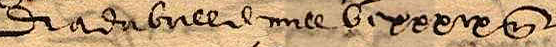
dia dabrill de mill bc xxxix ā
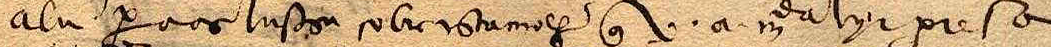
alū ꝑa as Iustas sobre esta molhē q̄ V. a. mda vyr presa
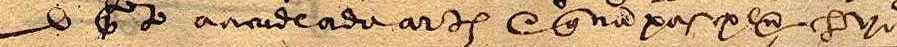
do p̄oto aa cadea da corte e q̄ nā pase plā chrya
